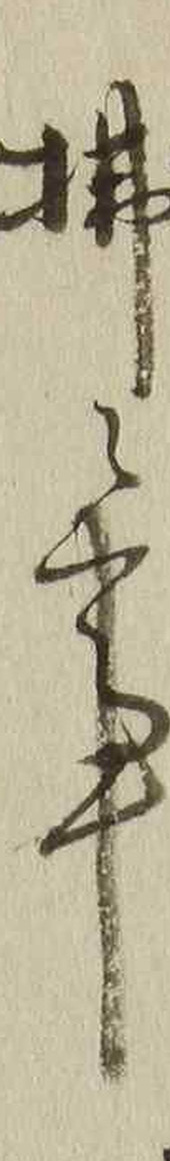払候事
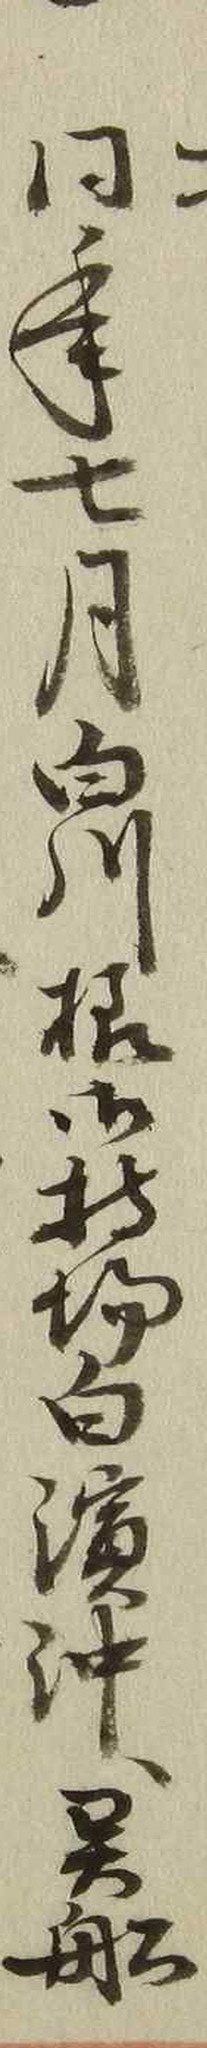一同年七月白川様御持場白浜沖へ異船
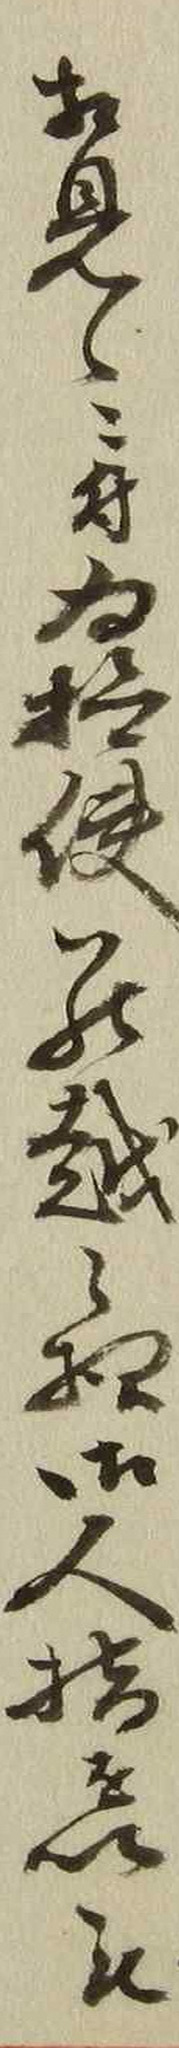相見候ニ付為検使罷越候様御人指を以被
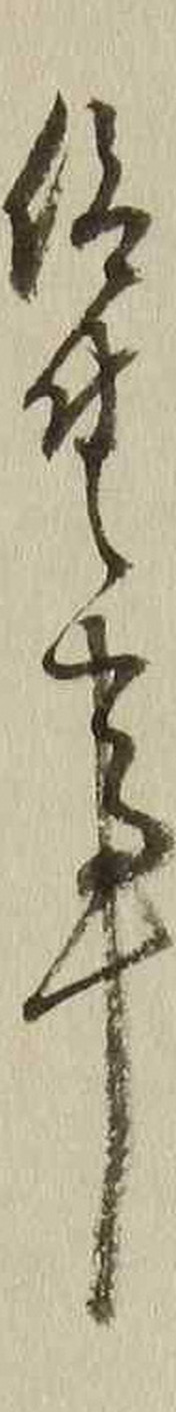仰付候事
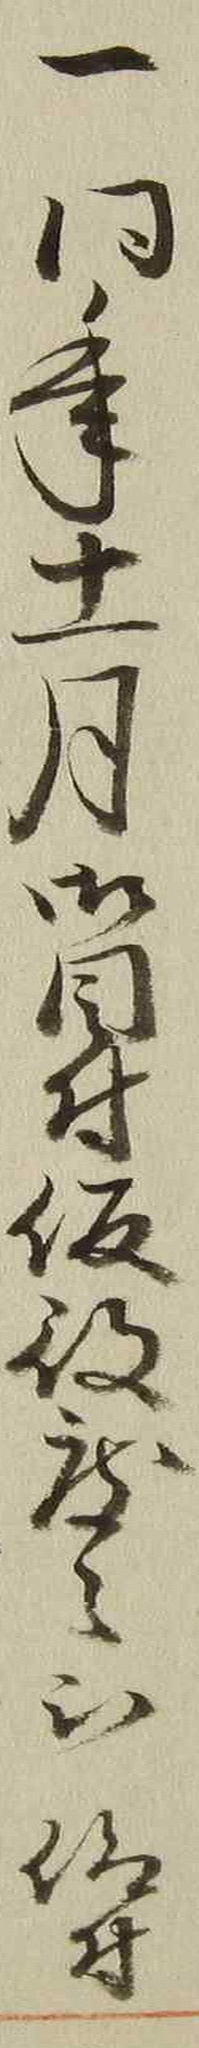一同年十一月御目付仮役度々被仰付
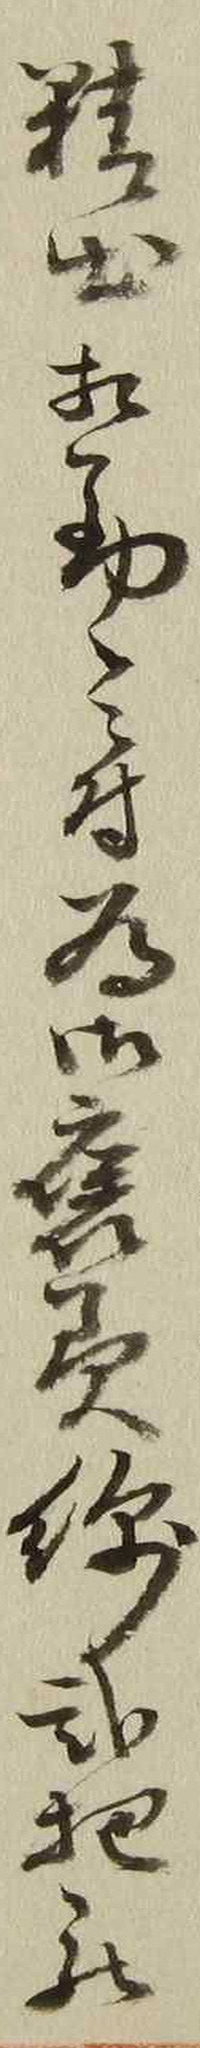精出相勤候ニ付為御褒美綿弐把被
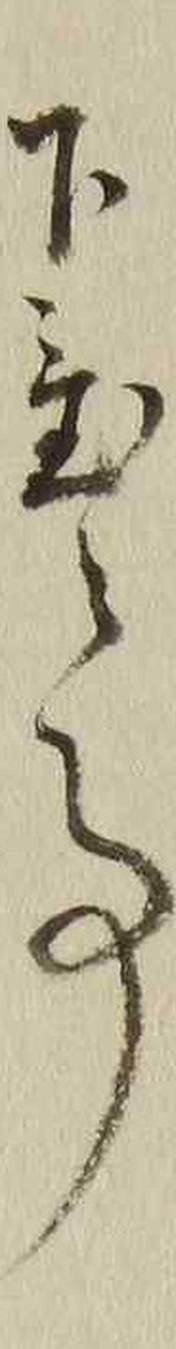下置候事
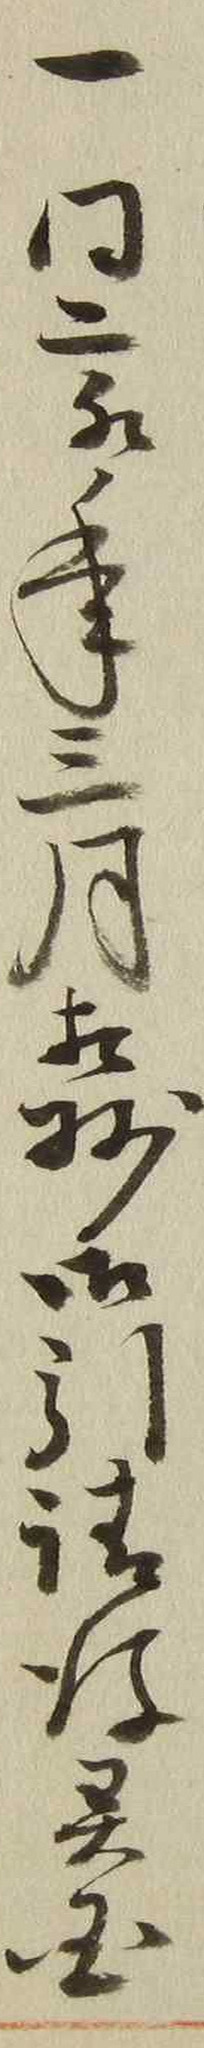一同二卯年三月相州御引請後異国
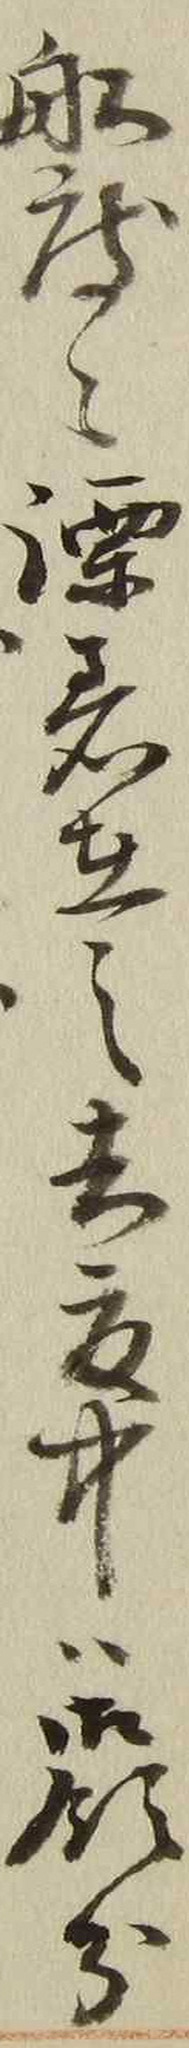船度々漂着在之去夏中ハ御領分
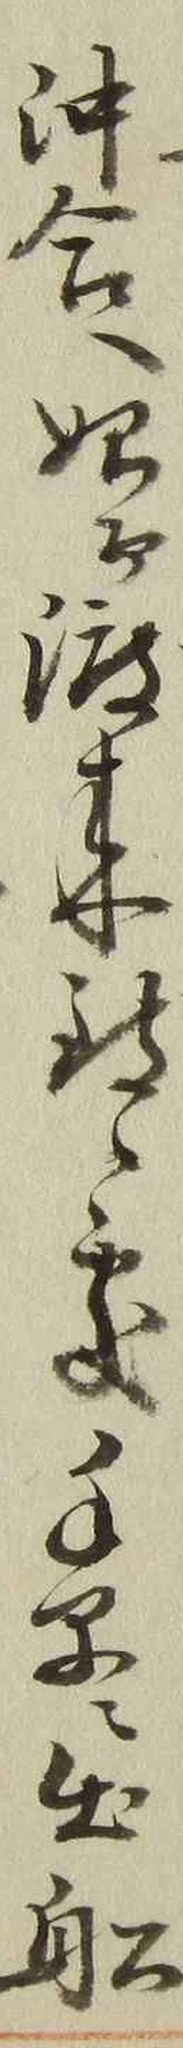沖合へ始而渡来致候処手早ニ出船
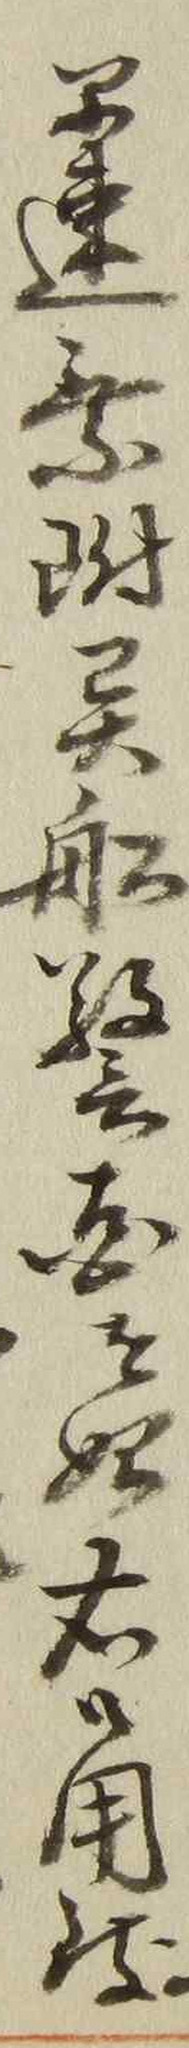早速乗附異船警固を始右御用致
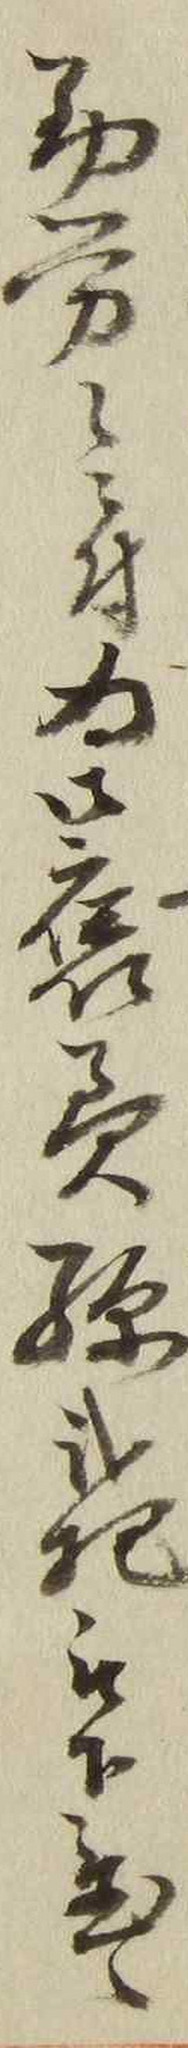勤労候ニ付為御褒美綿弐把被下置候
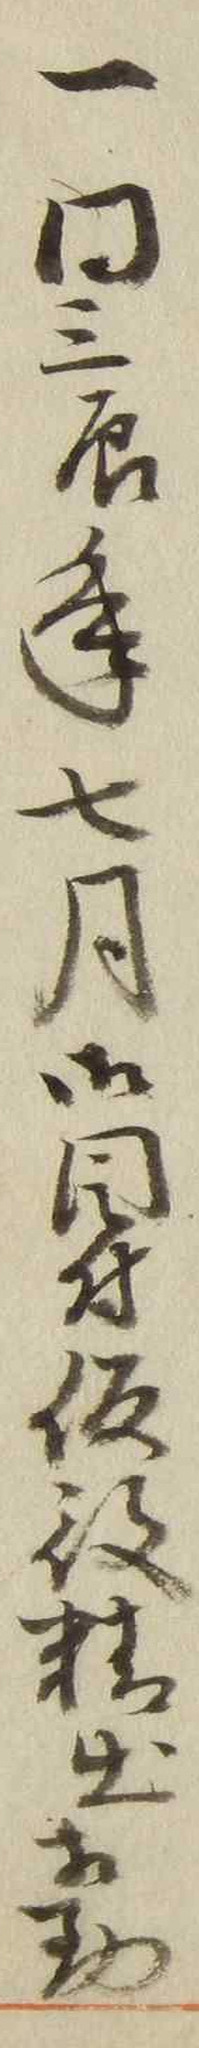一同三辰年七月御目付仮役精出相勤

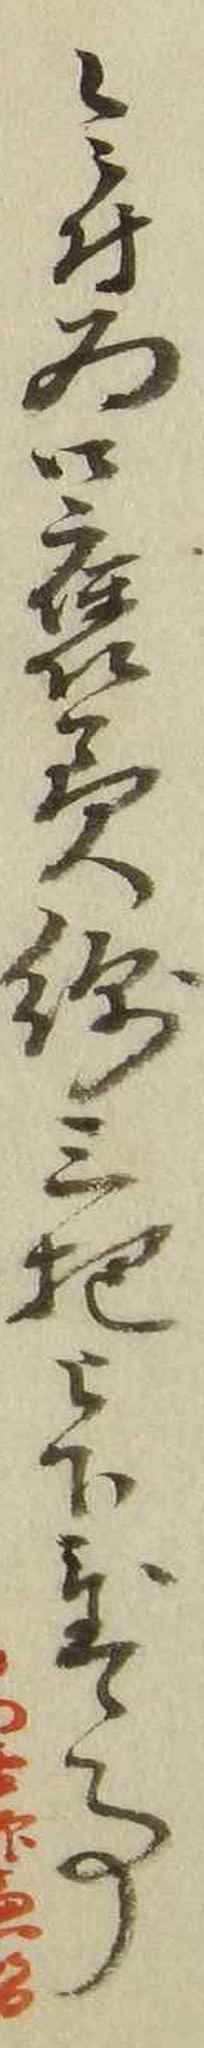候ニ付為御褒美綿三把被下置候事
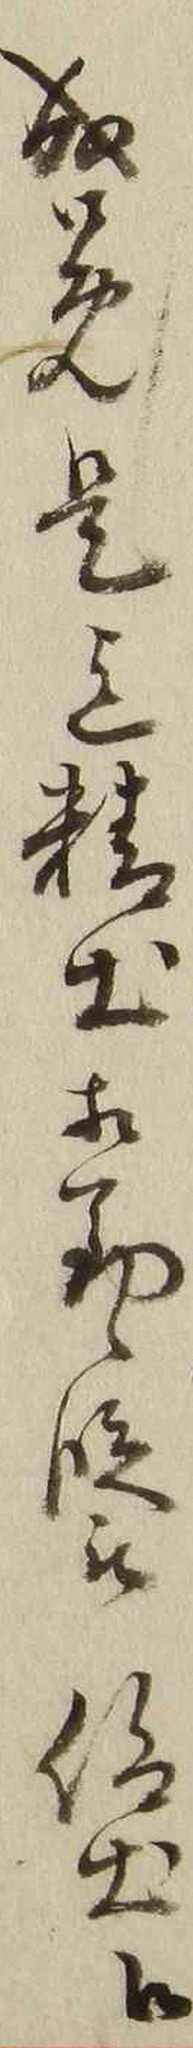成御免是迄精出相勤候段被仰出候
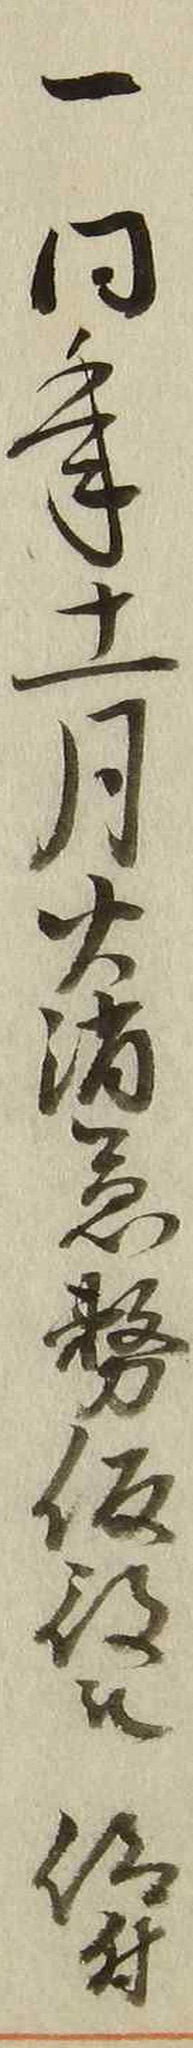一同年十一月火消兼務仮役被仰付
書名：諸士系譜　巻之53　に之部4
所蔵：会津若松市立会津図書館
